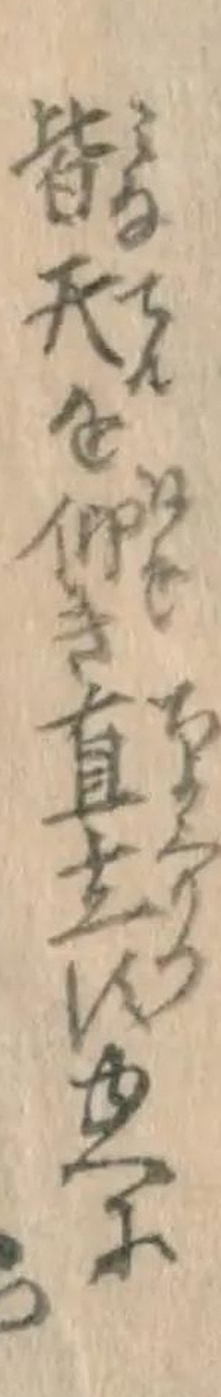皆天を仰き直立すゆへに
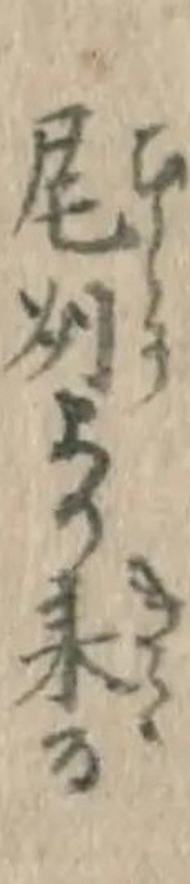尾州より来る
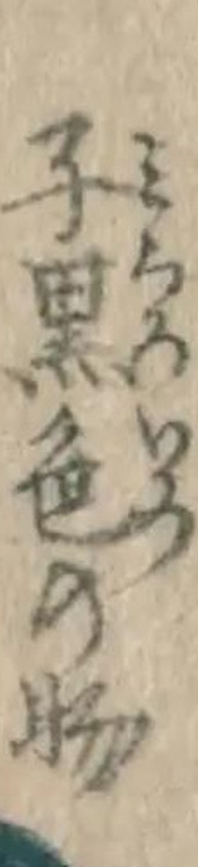子黒色の物

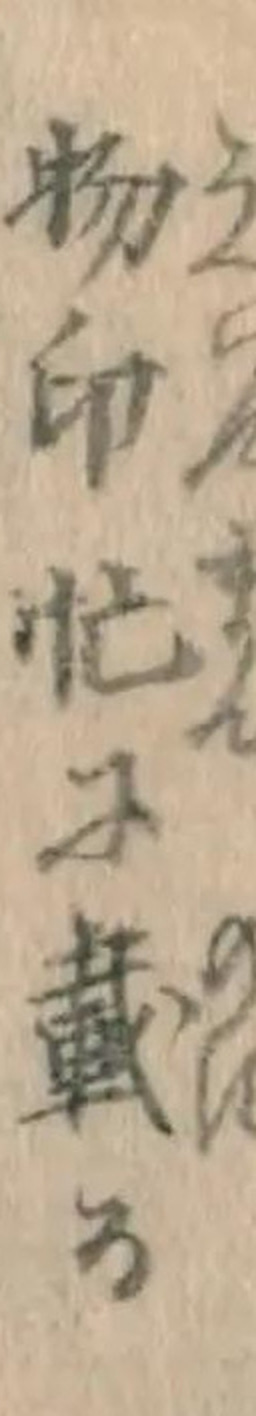物印忙に載る
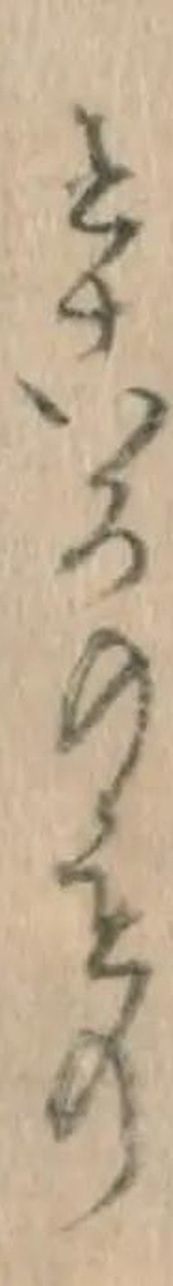ところのもの

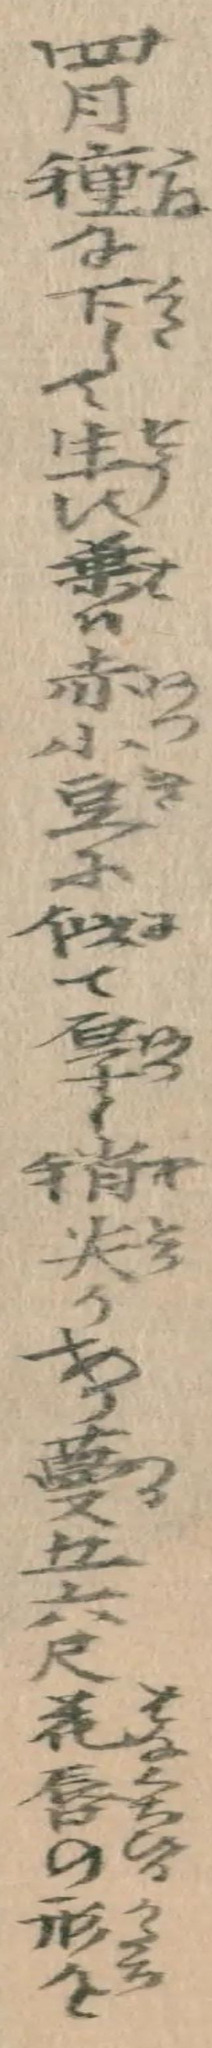四月種を下して生す葉は赤小豆に似て厚く稍尖りあり蔓五六尺花唇の形を
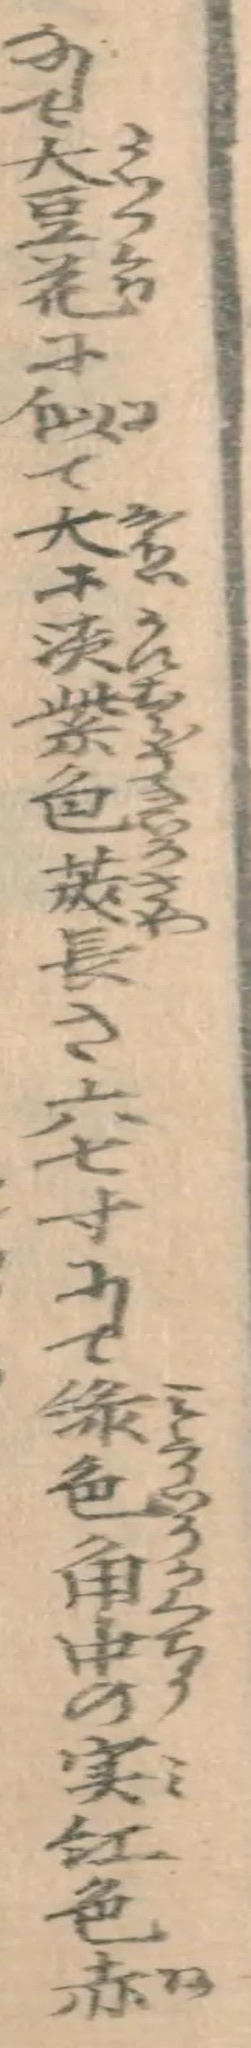にして大豆花に似て大に淡紫色莢長さ六七寸にして緑色角中の実紅色赤
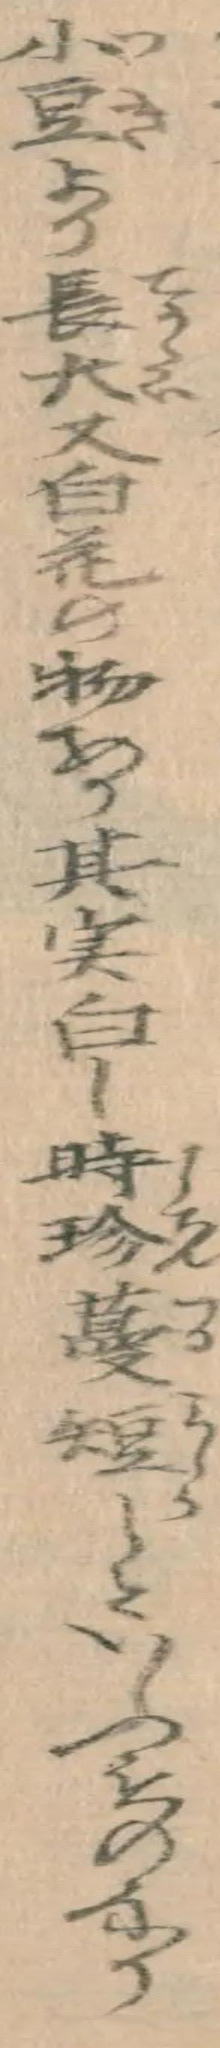小豆より長大又白花の物あり其実白し時珍蔓短しといふものなり
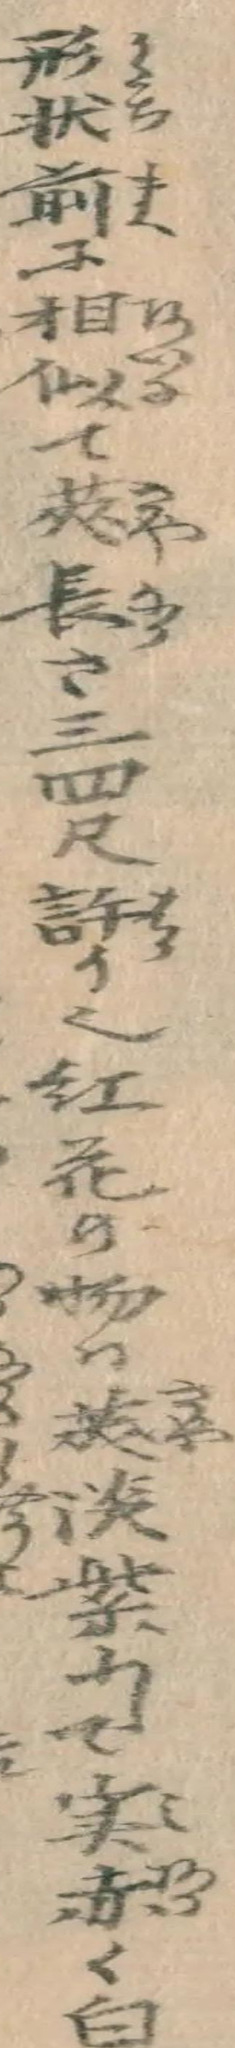形状前に相似て莢長さ三四尺許り也紅花の物は莢淡紫にして実赤く白
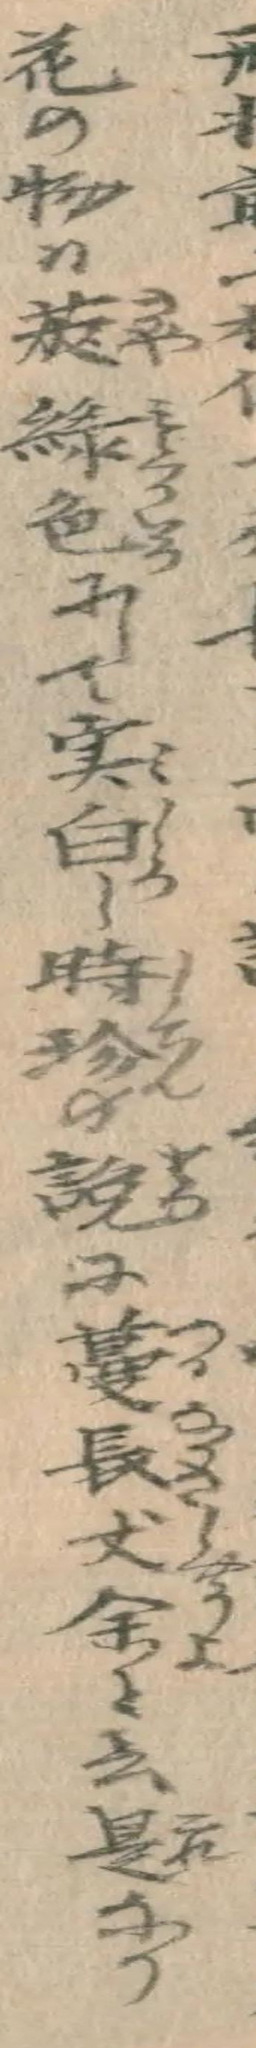花の物は莢緑色にして実白し時珍の説に蔓長丈余と云是なり

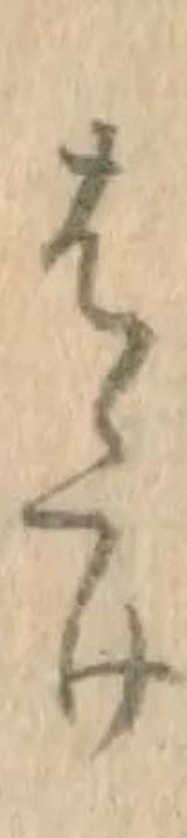はたけ
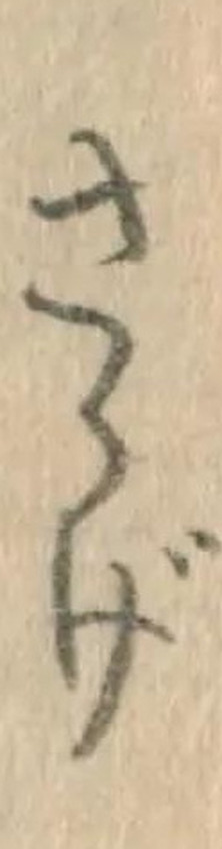さゝげ
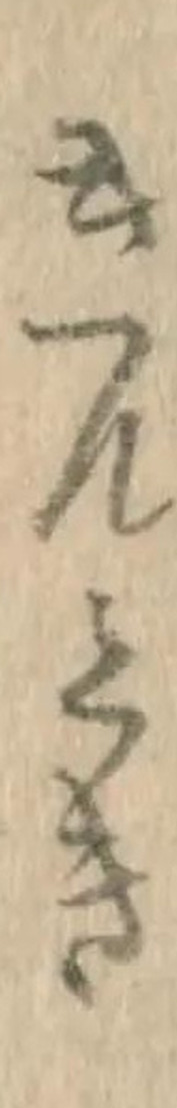きんとき
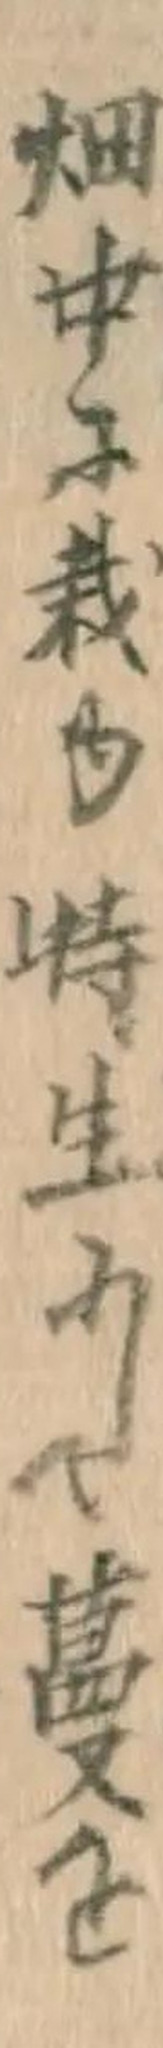畑中に栽ゆ特生にして蔓を
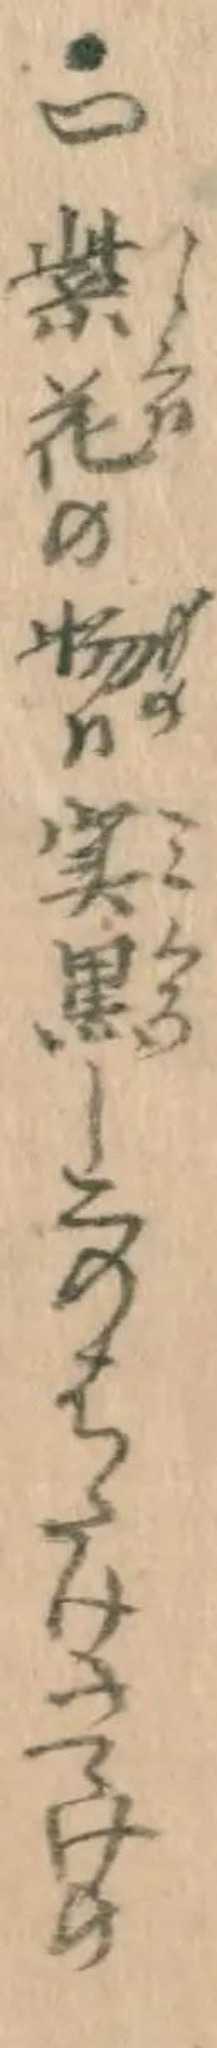●○紫花の物は実黒しこのはたけさゝけの
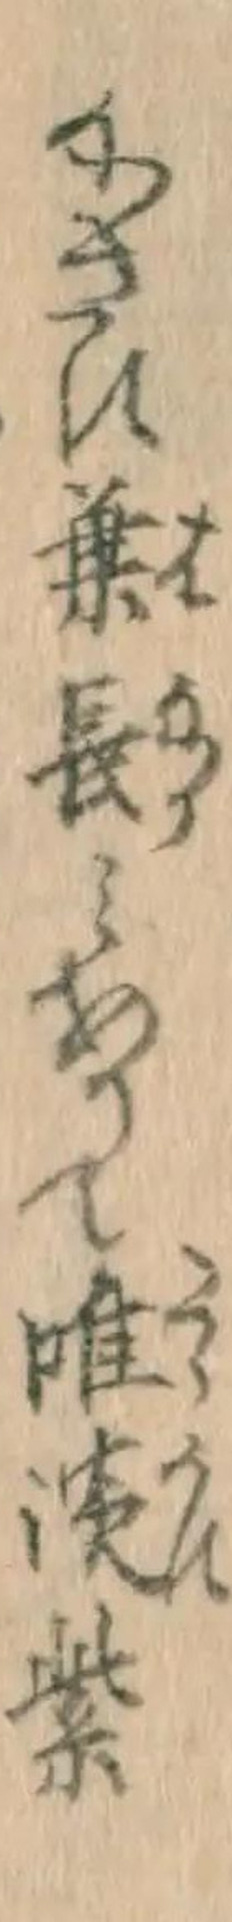なさす葉長みありて唯淡紫
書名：本草図譜. 巻43-45
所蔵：国立国会図書館 National Diet Library, JAPAN
